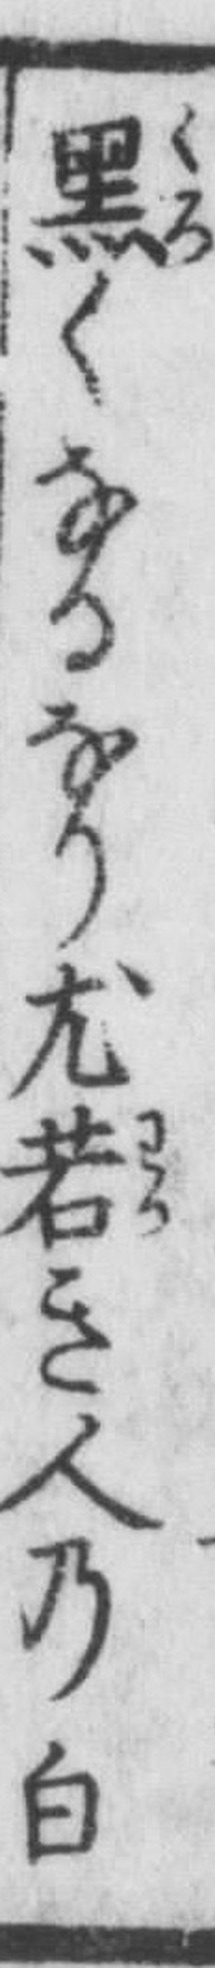黒くなるなり尤若き人の白
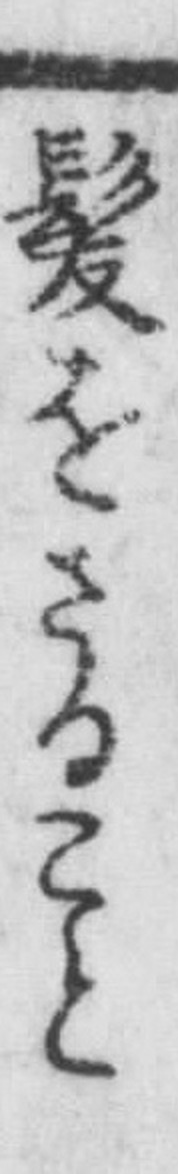髪をさること
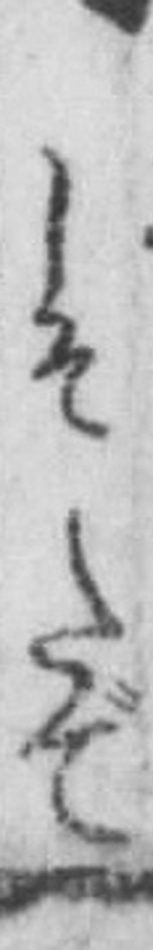しそたで
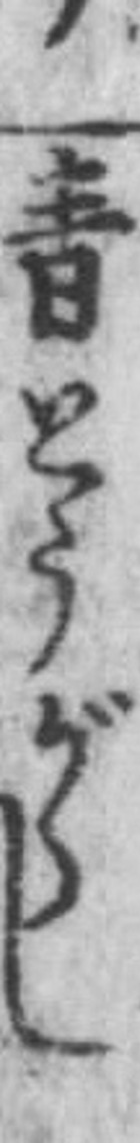青とうがらし

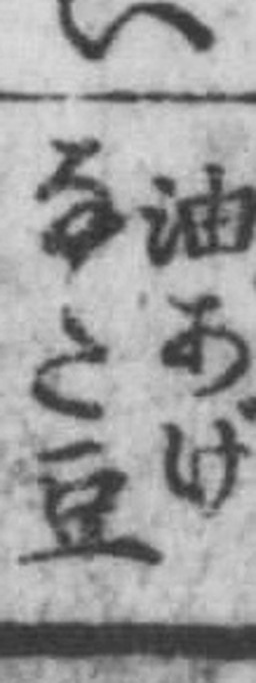なた豆
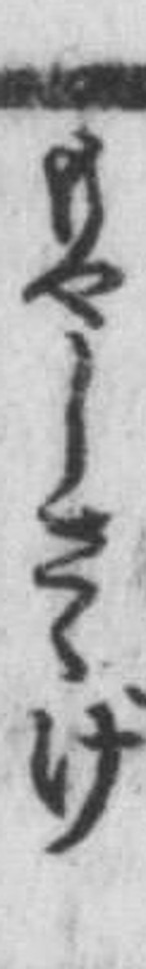もやしさゝげ
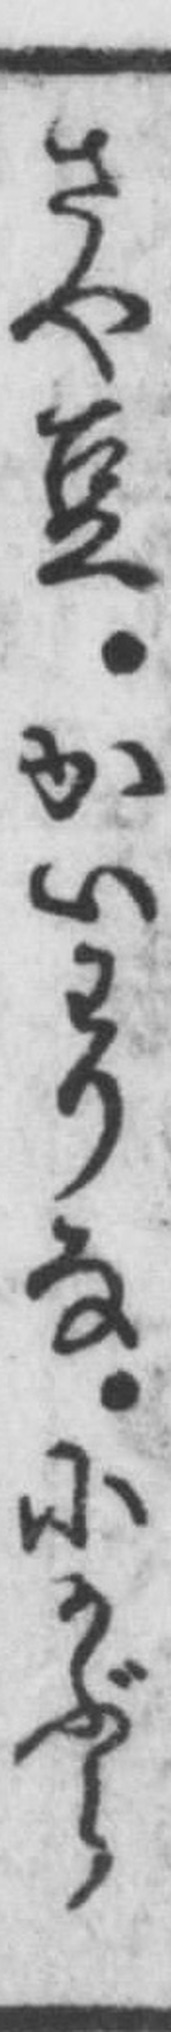さや豆かいわりな小かぶら
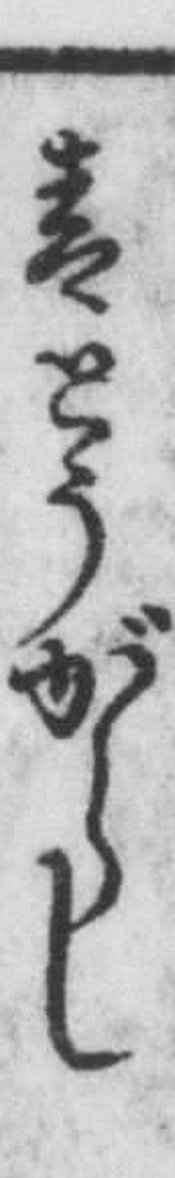青とうがらし
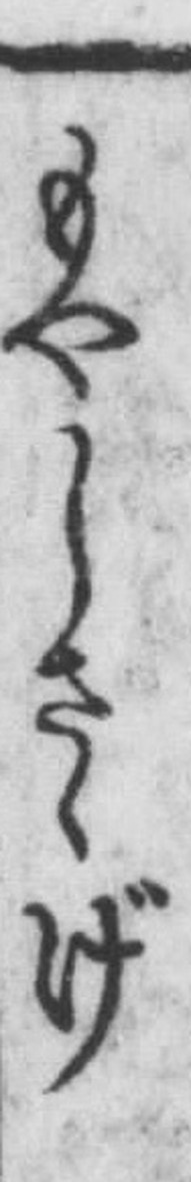もやしさゝげ
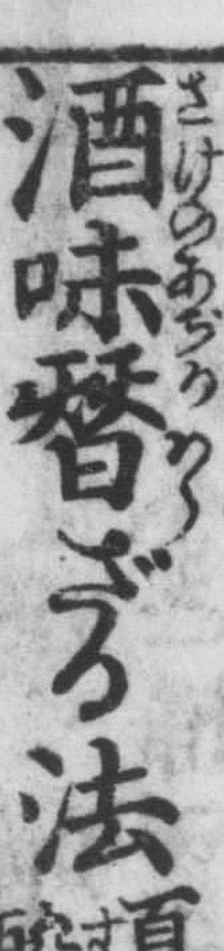酒の味替ざる法
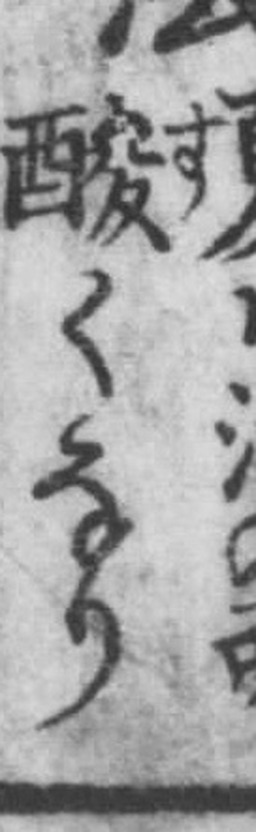酸くなり
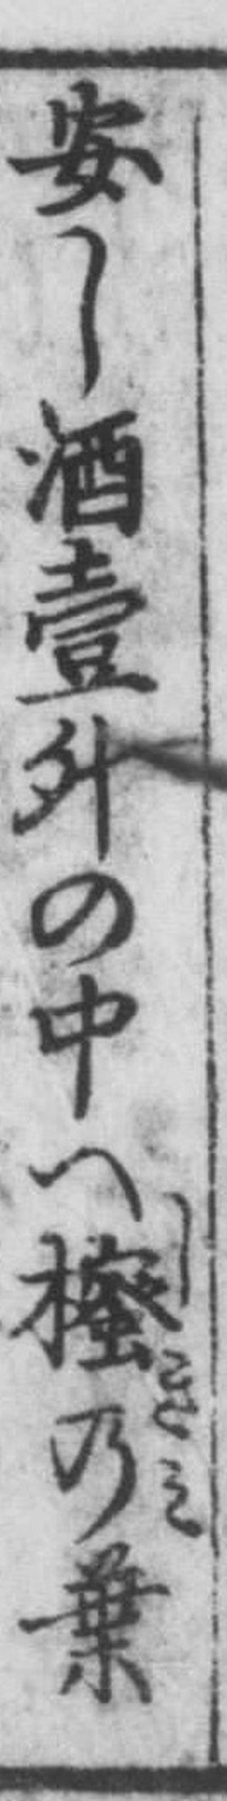安し酒壺外の中へ樒の葉
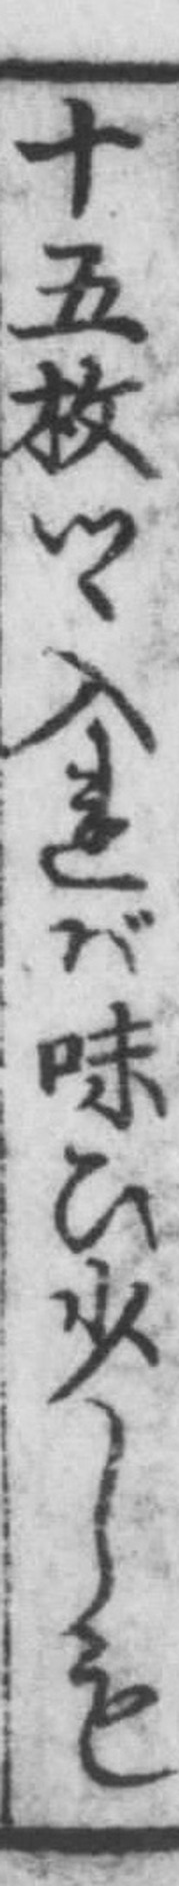十五枚つゝ入れバ味ひ少しも
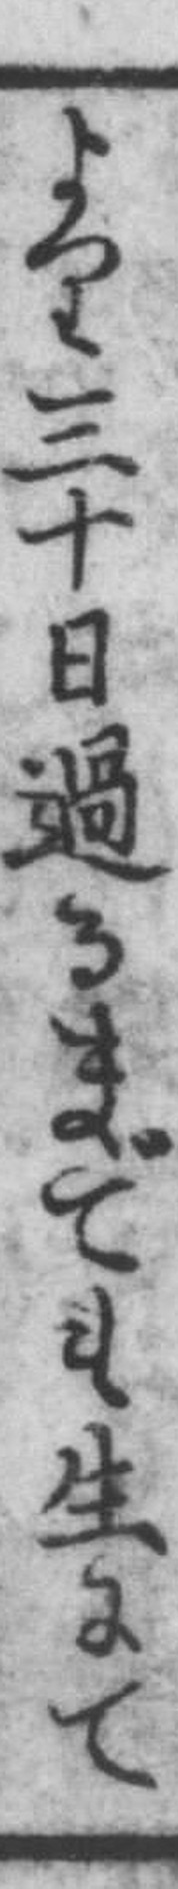より三十日過るまでも生にて
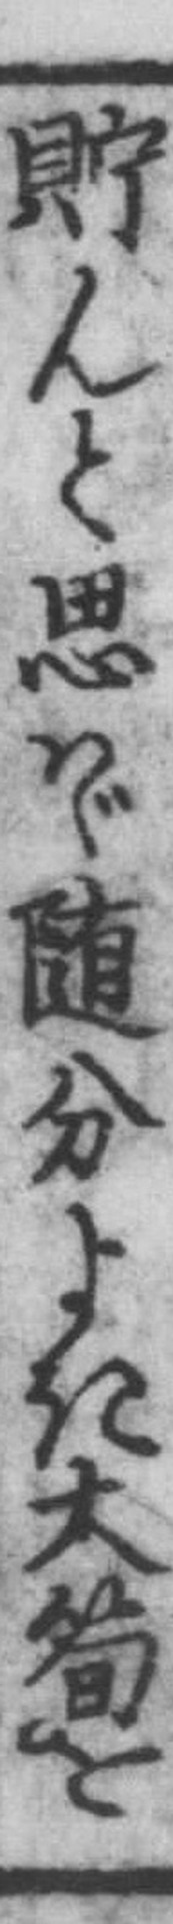貯んと思うハゞ随分よき大筍を

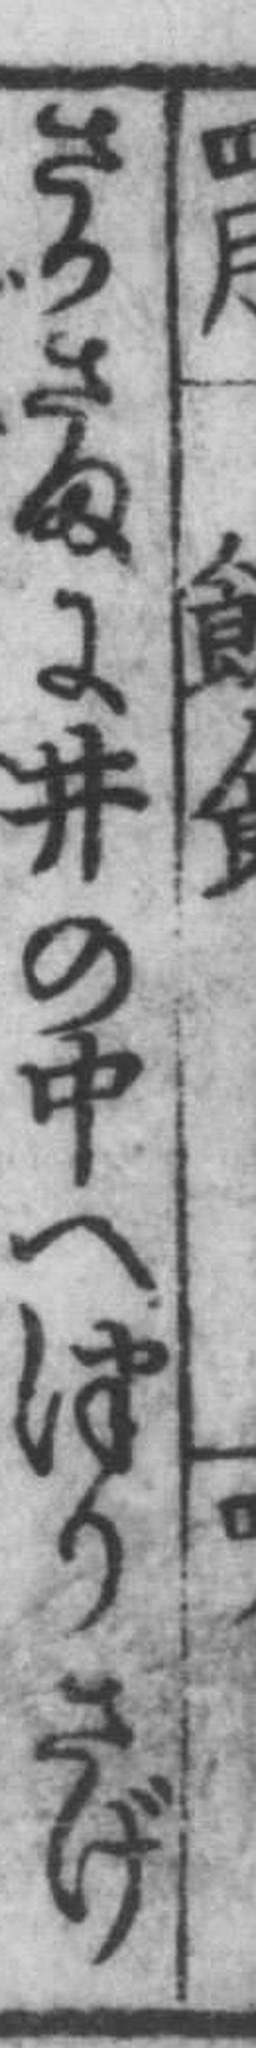さかさまに井の中へほりさげ
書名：当世料理筌
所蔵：大阪府立大学学術情報センター 国文学研究資料館
